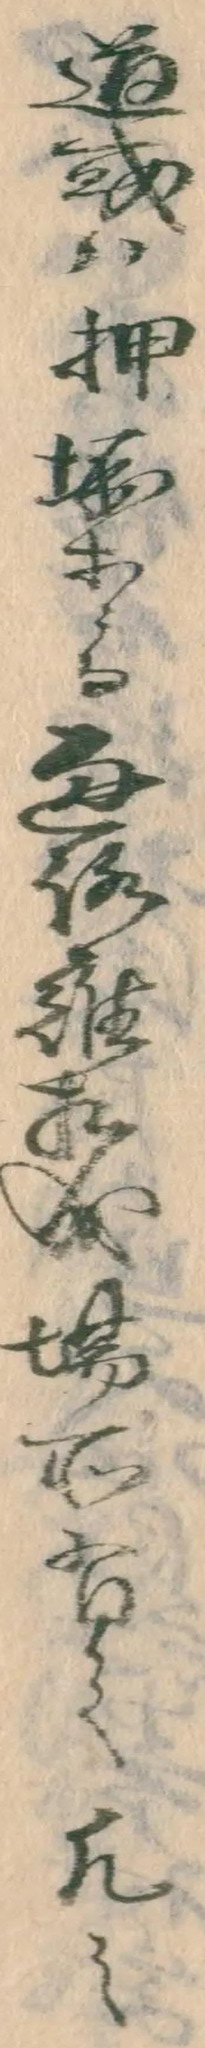道或ハ押掘等ニ而通路難相成場所有之凡之
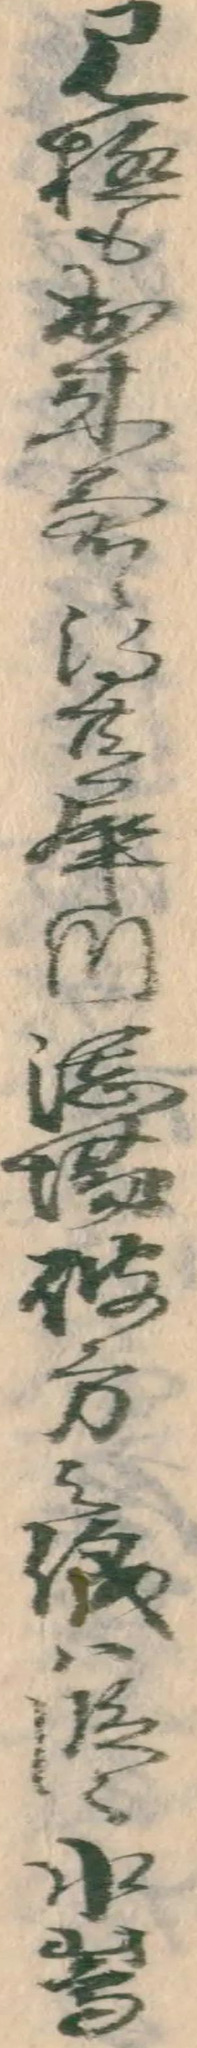見積りも出来兼候得共犀川湛場破方之儀ハ段々水嵩
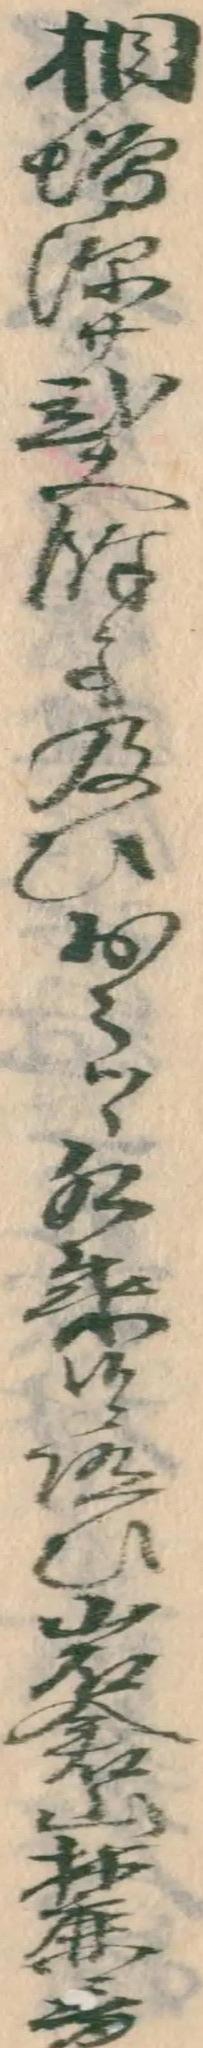相増深サ弐丈ニも及ひ少々ツッ水乗候ニ随ひ岩倉山麓之方
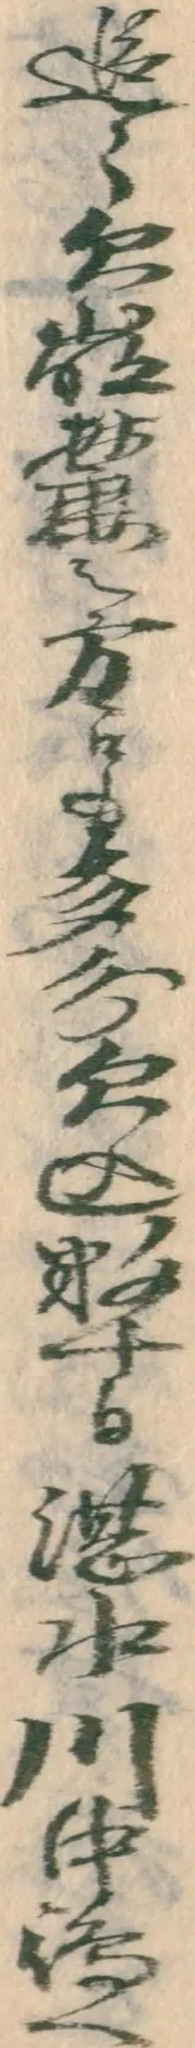追々欠崩麓之方江も多分欠込数十日湛水川中島へ
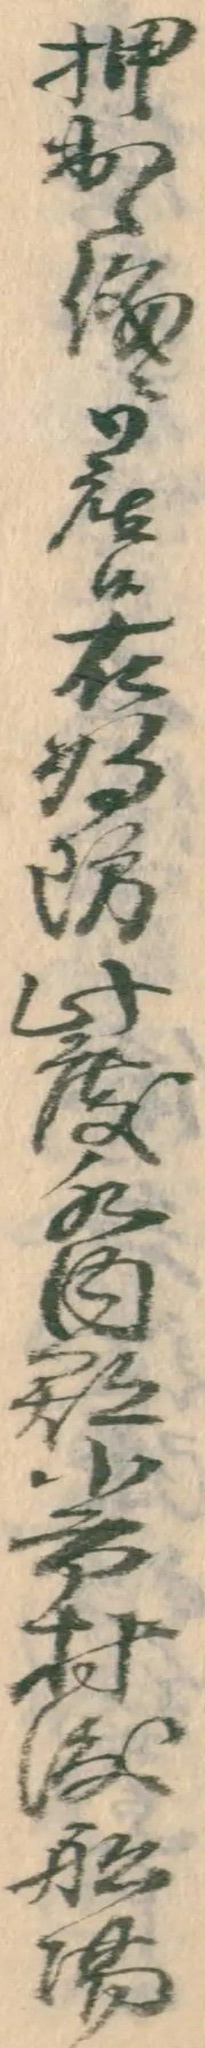押出候儀ニ御座候右為防此度水内郡小市村渡船場

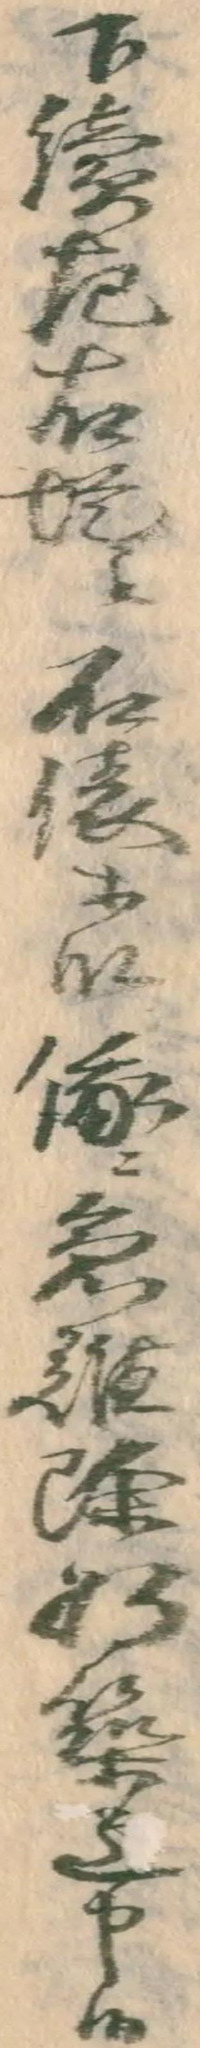下続左右之堤之石俵等以俄ニ急難除為築立申候
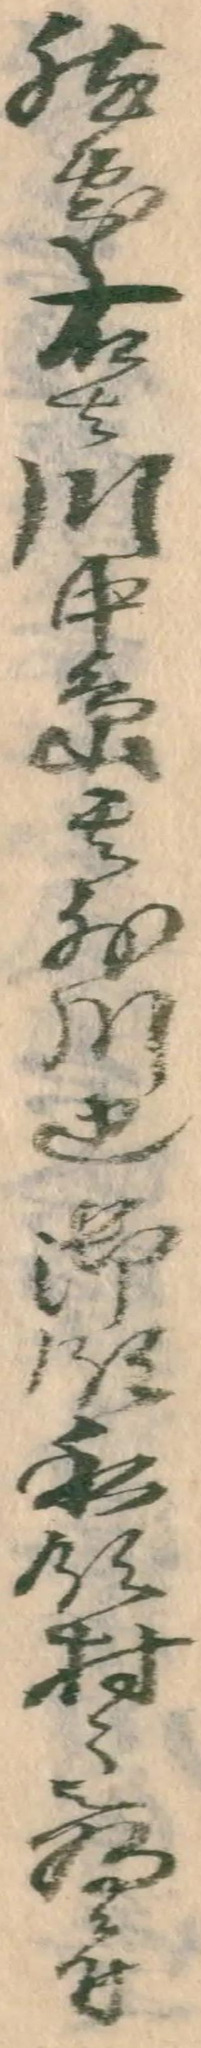然処右者川中島其外川辺御料私領村々之為ニ付
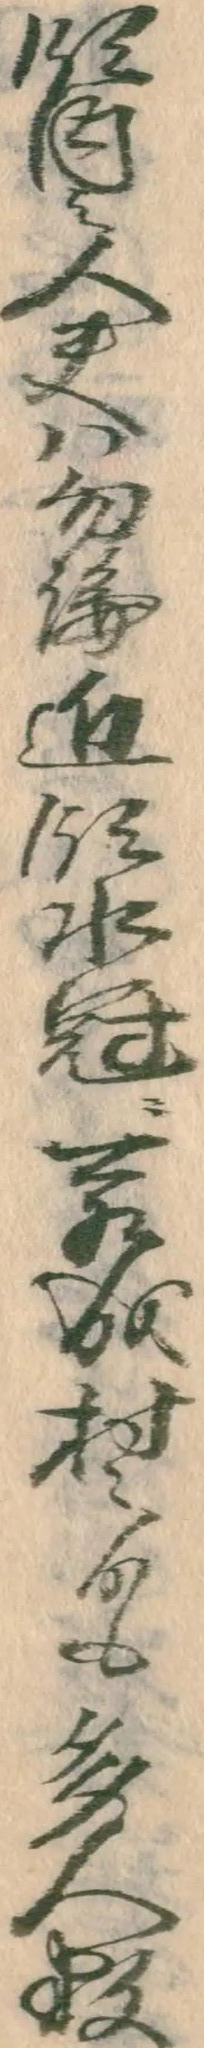領内之人夫ハ勿論近領水冠ニ可相成村々ゟも多人数
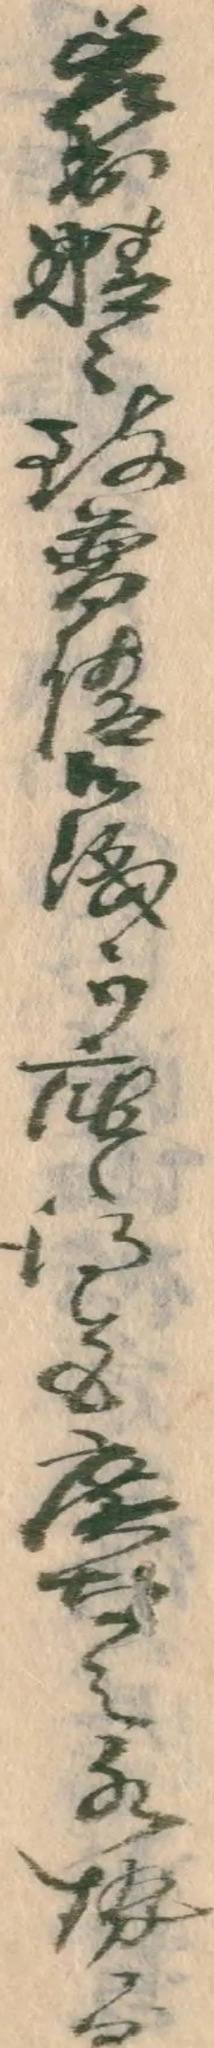差出精々致普請候儀ニ御座候得とも広太之水勢ニ而
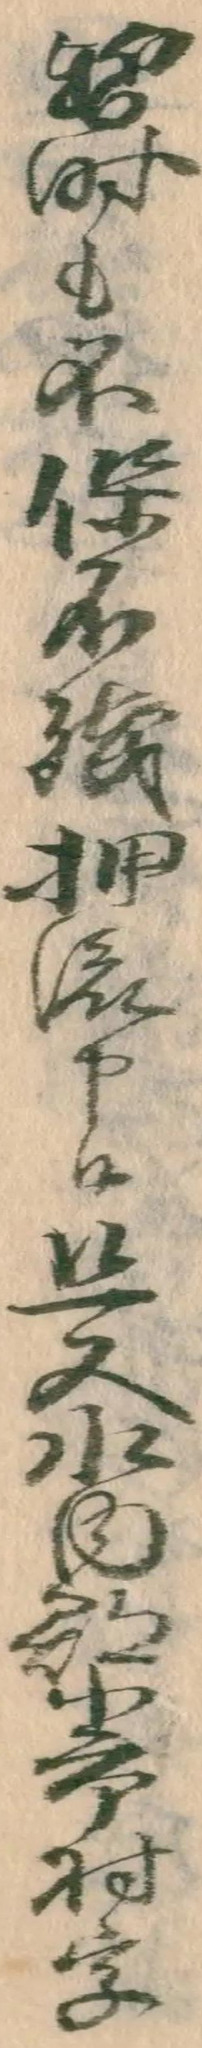暫時も不保不残押流申候且又水内郡小市村之字
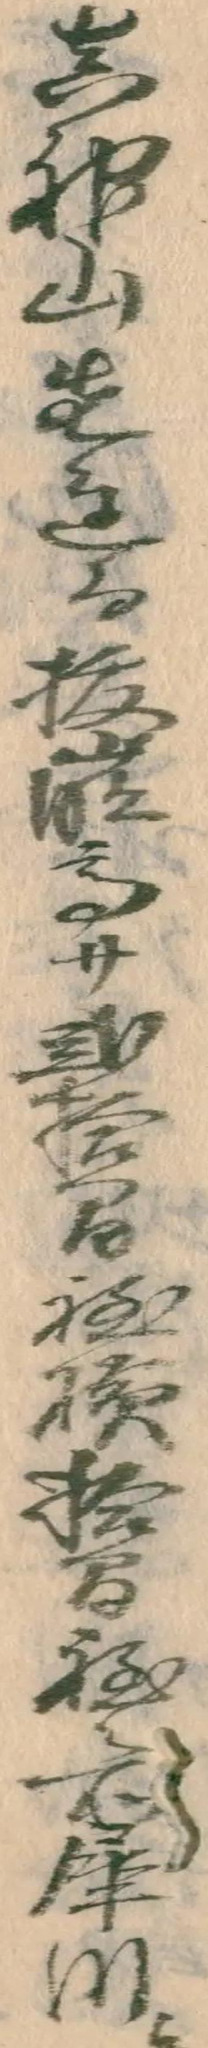真神山先達而抜崩高サ弐拾間程横拾間之所犀川江
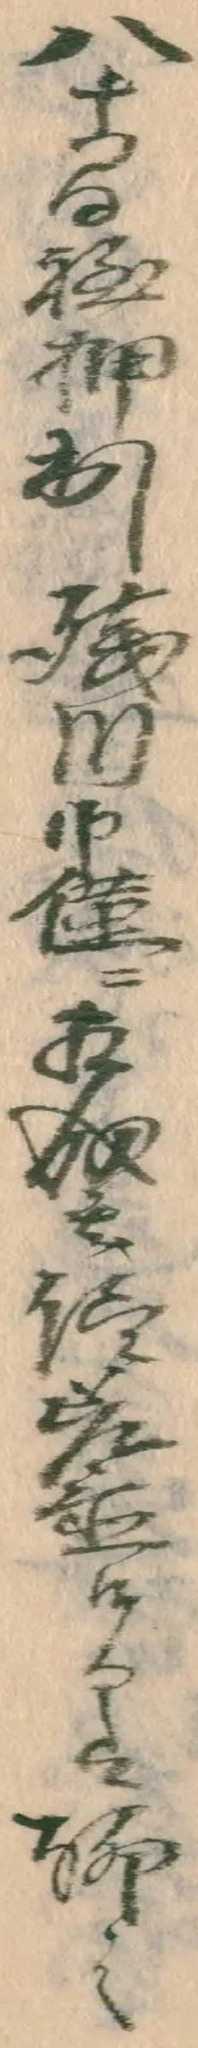八十間程押出し残川幅僅ニ相成其侭差置候而は聊之
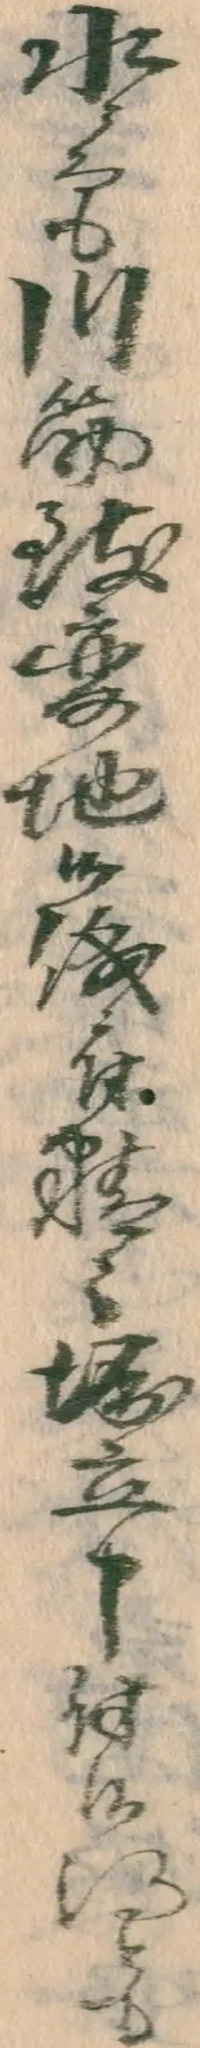水ニ而も川筋致変地候儀ニ付精々掘立申付候得とも
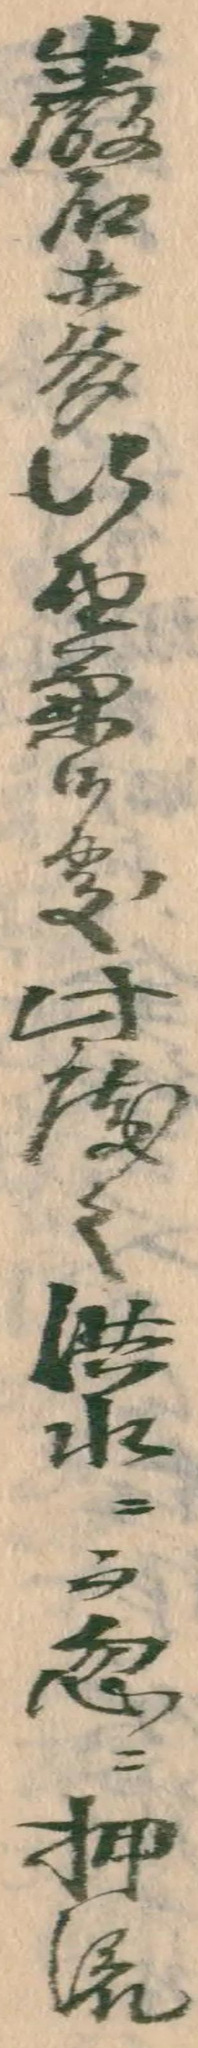巌石等多行届兼候処此度之洪水ニ而忽ニ押流
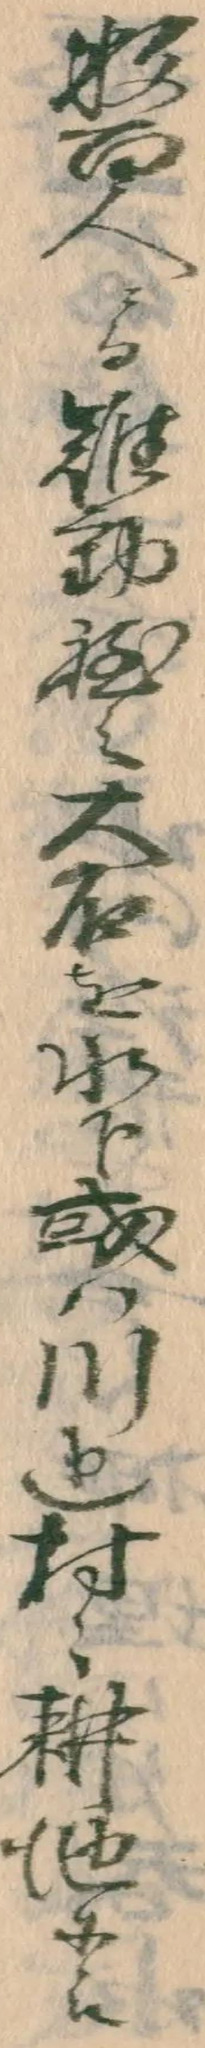数百人ニ而難動程之大石ヲ川下或ハ川辺村々耕地等江
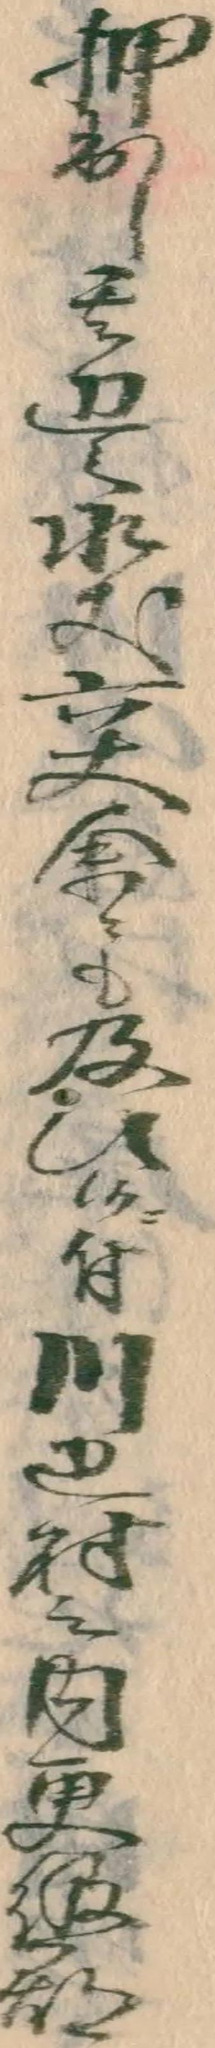押出し其辺之水丈六丈余ニも及候ニ付川辺村々之内更級郡
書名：信州大地震之記
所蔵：国立国会図書館 National Diet Library, JAPAN
